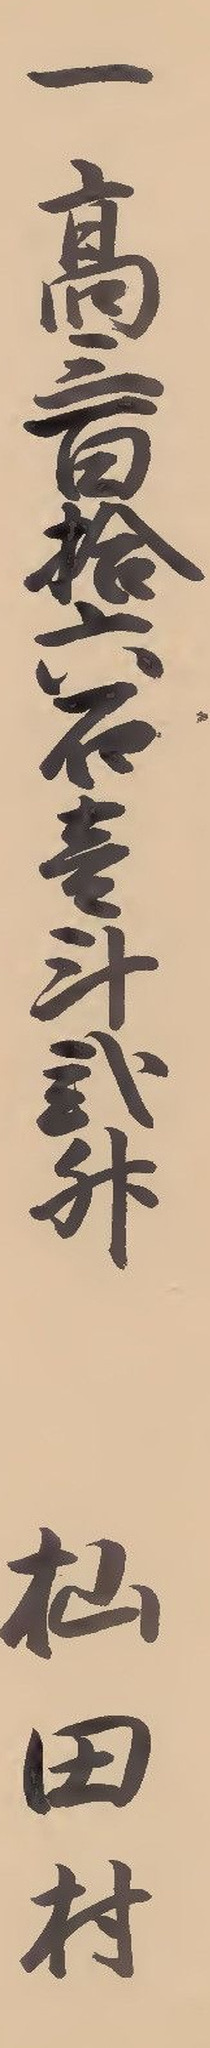一高三百拾六石壱斗弐升杣田村
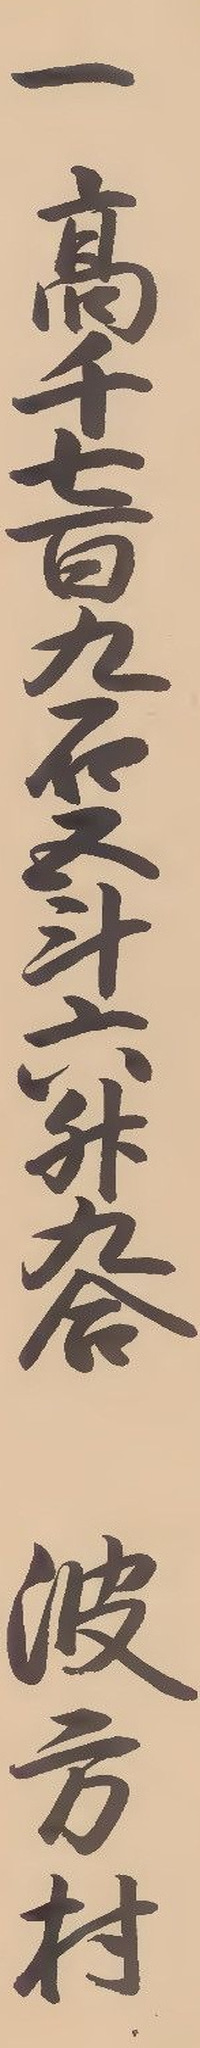一高千七百九石五斗六升九合波方村
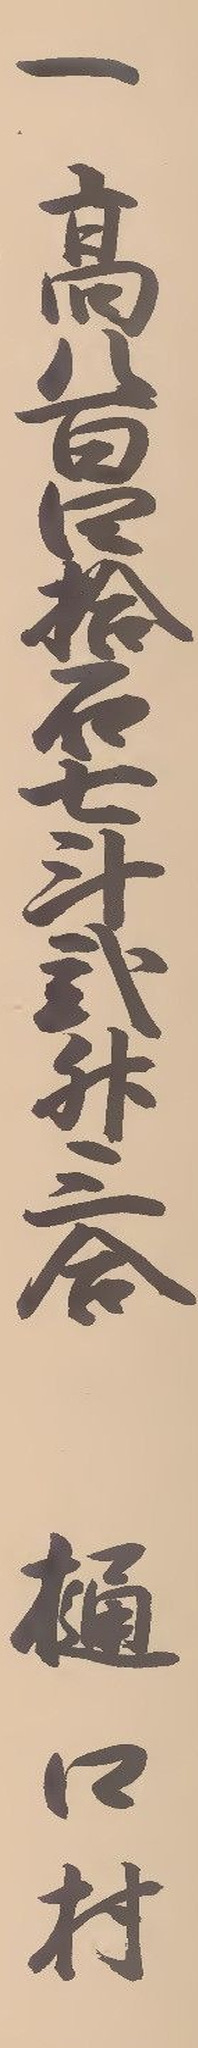一高八百四拾石七斗弐升三合樋口村
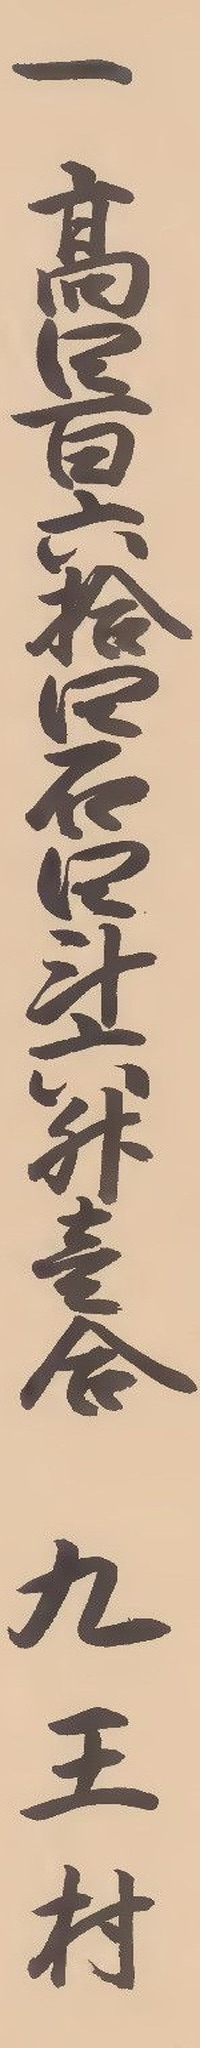一高四百六拾四石四斗六升壱合九王村
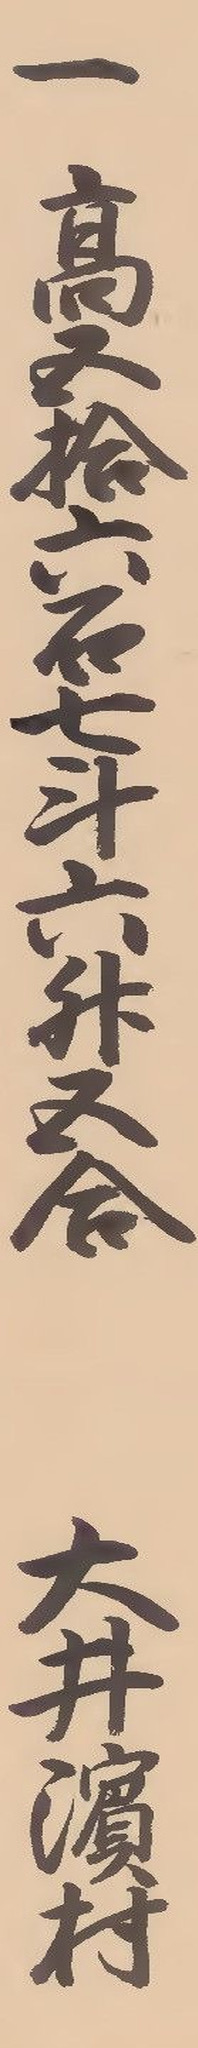一高五拾六石七斗六升五合大井浜村
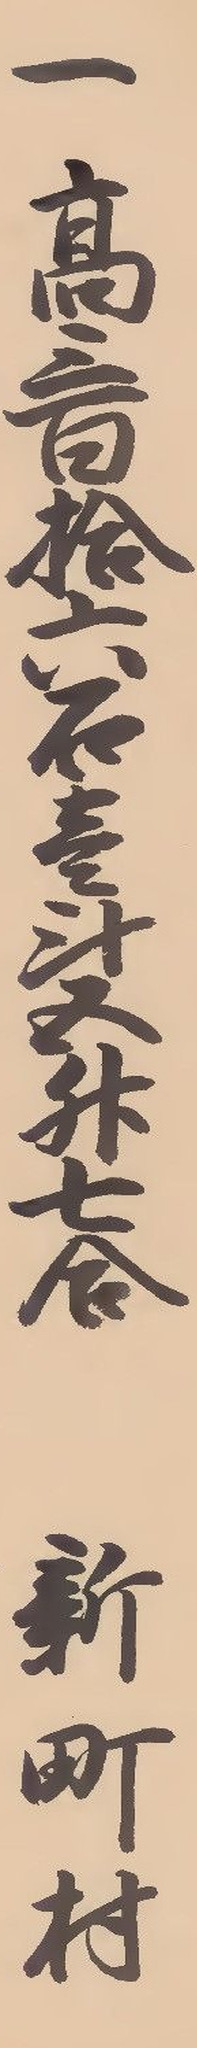一高三百拾六石壱斗五升七合新町村

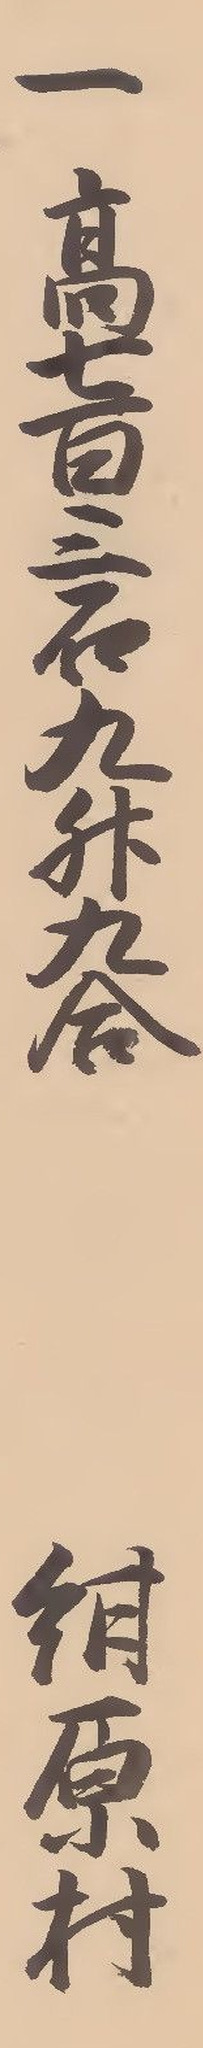一高七百三石九升九合紺原村
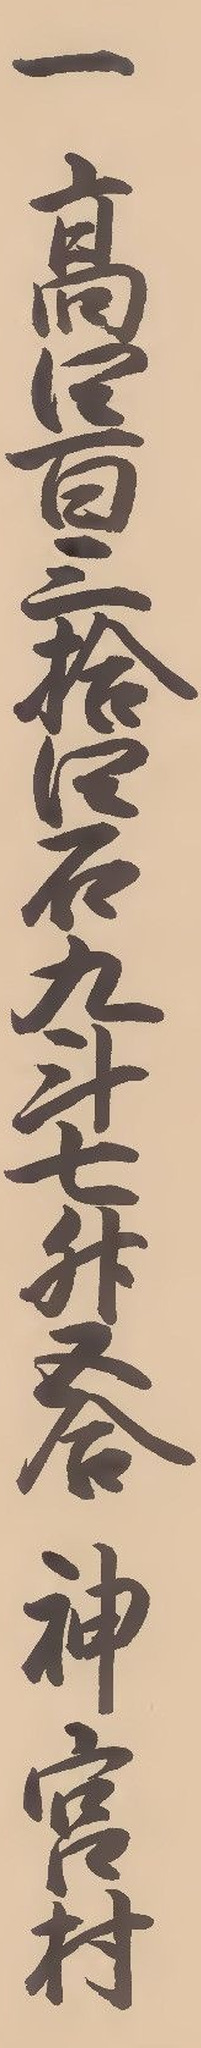一高四百三拾四石九斗七升五合神宮村
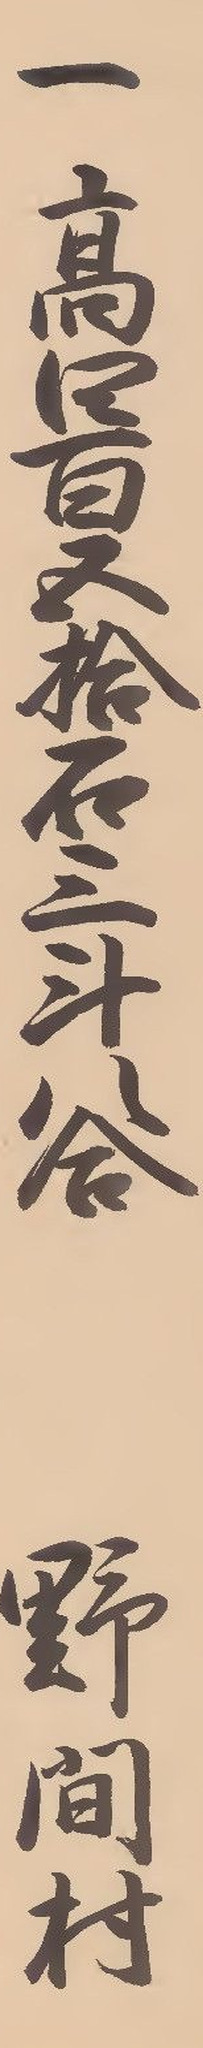一高四百五拾石三斗八合野間村
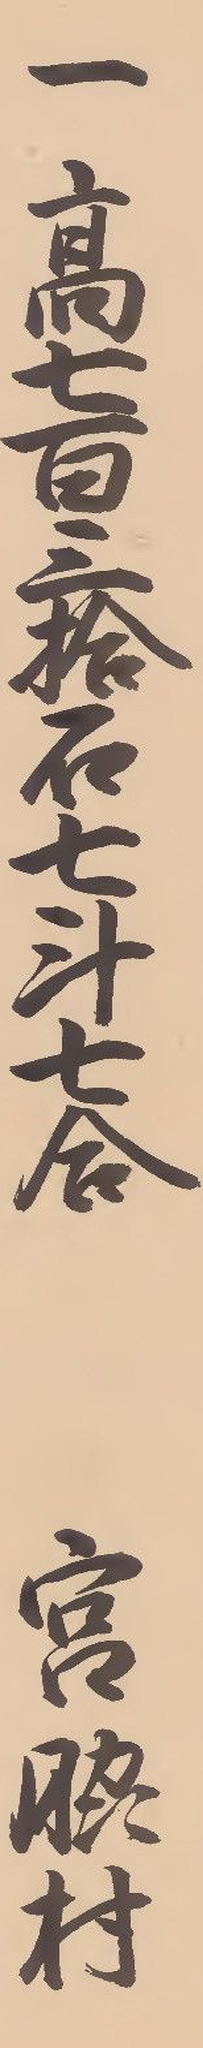一高七百三拾石七斗七合宮脇村
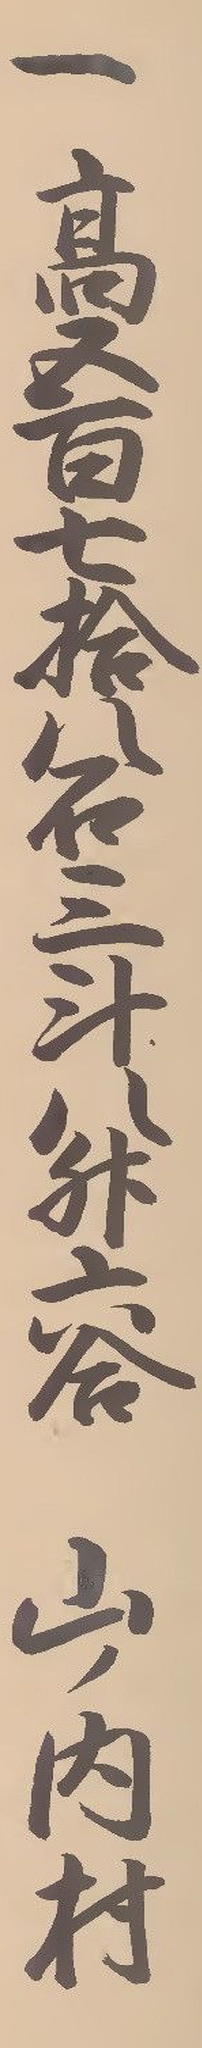一高五百七拾八石三斗八升六合山ノ内村
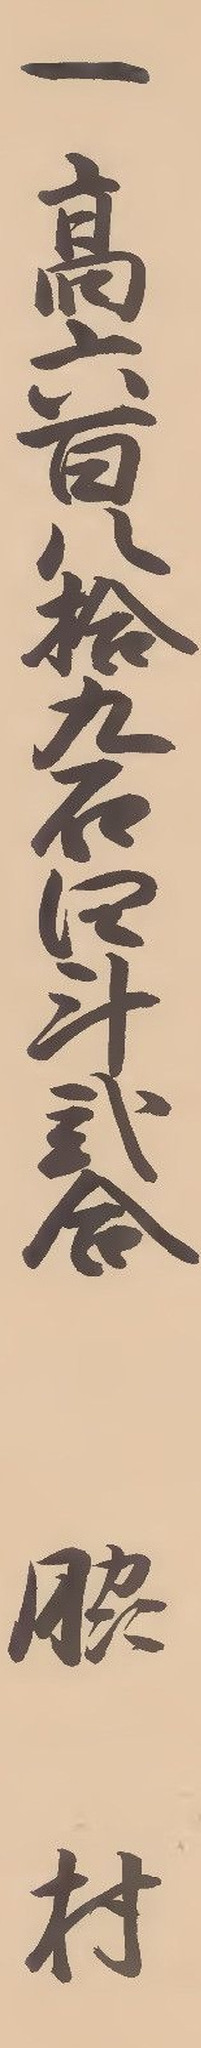一高六百八拾九石四斗弐合脇村
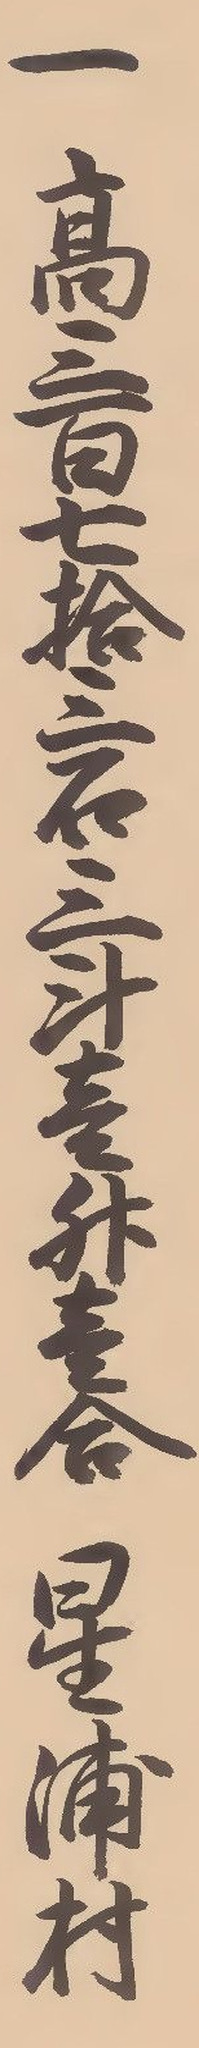一高三百七拾三石三斗壱升壱合星浦村
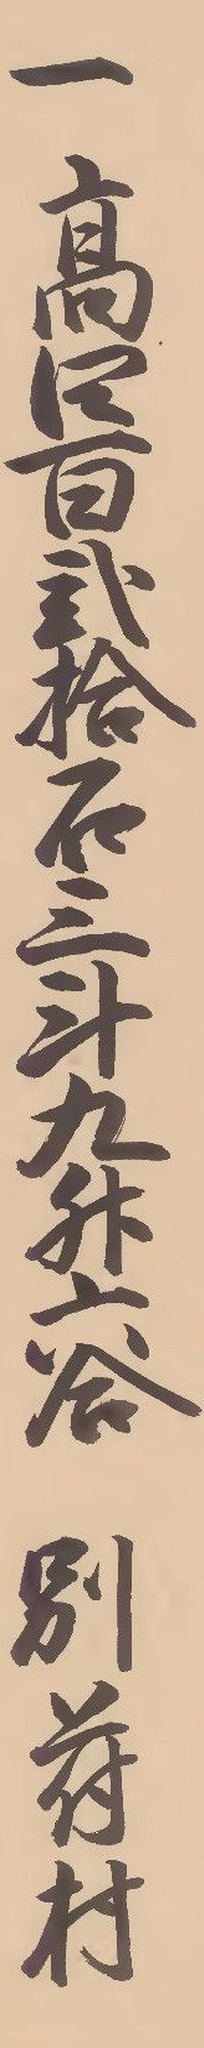一高四百弐拾石三斗九升六合別符村

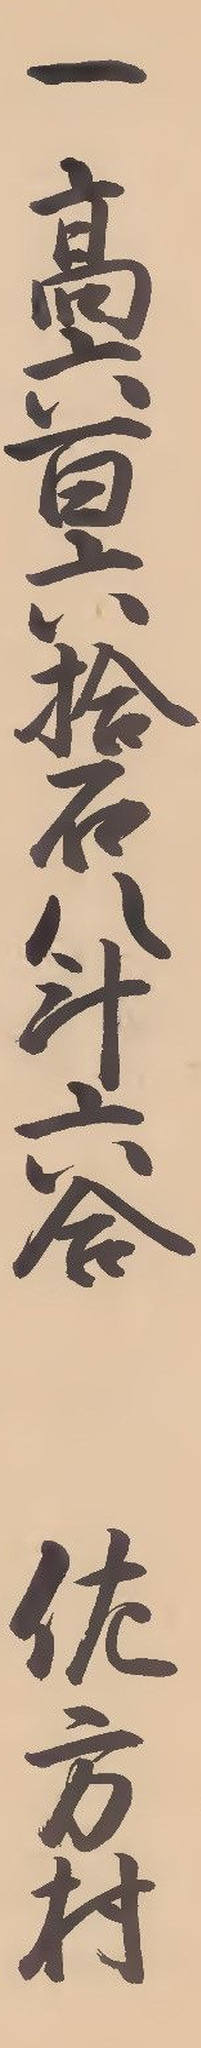一高六百六拾石八斗六合佐方村
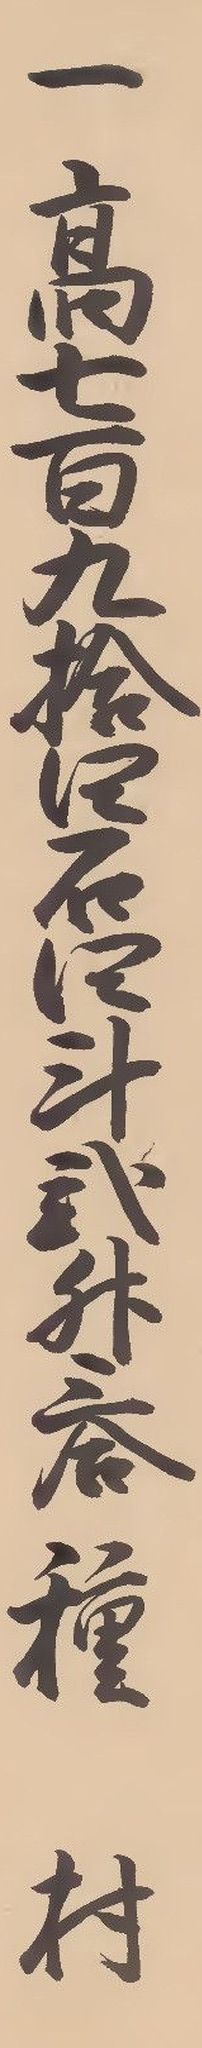一高七百九拾四石四斗弐升三合種村
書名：伊予国郷帳
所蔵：国立公文書館 National Archives of Japan
